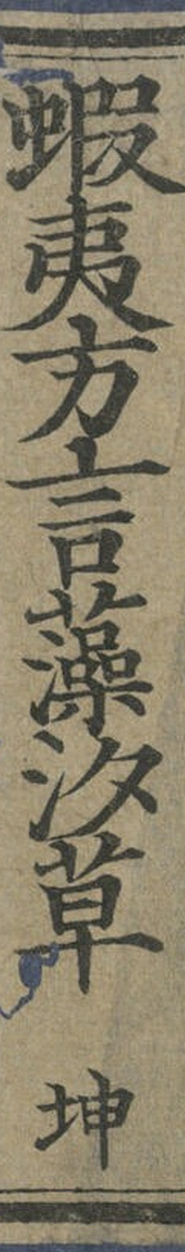蝦夷方言藻汐草坤

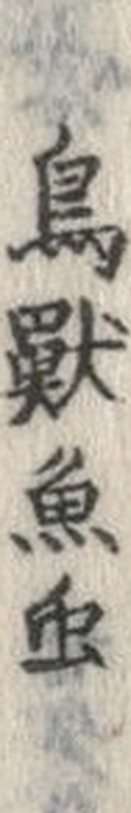鳥獣魚虫
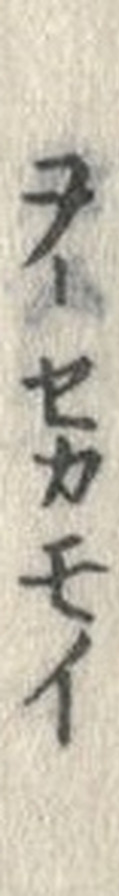狼ヲーセカモイ

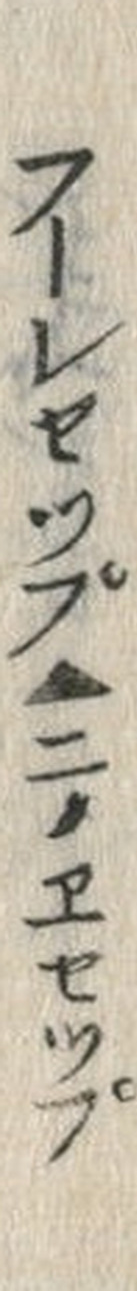鯛フーレセツプ▲ニノヱセツプ

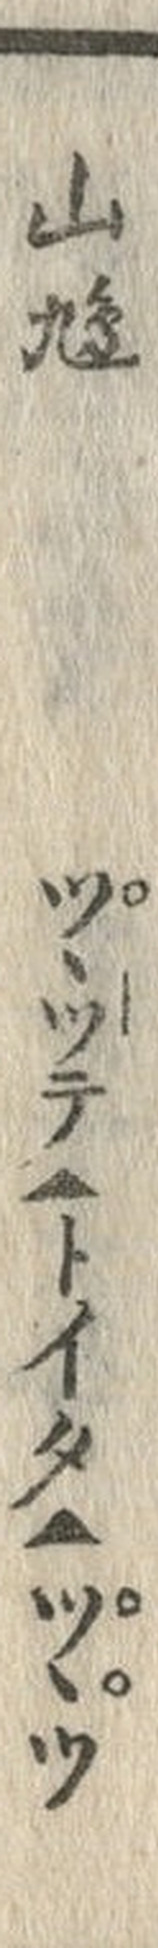山鳩ツ゚ヽツテ▲トイタ▲ツ゚ヾツ
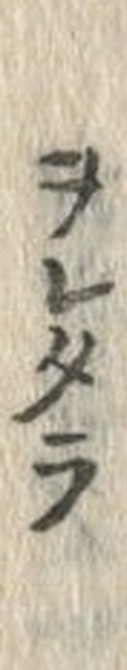ヲレタラ
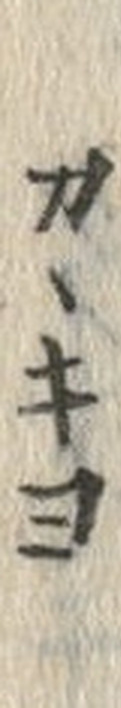カヽキヨ
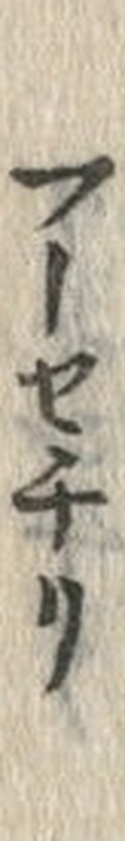フーセチリ
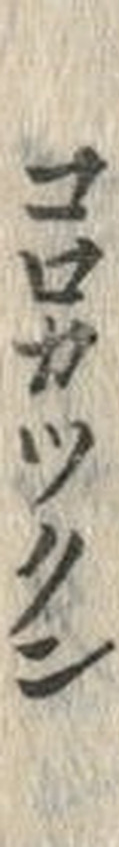コロカツクン
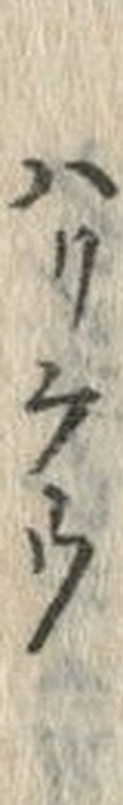ハリケウ
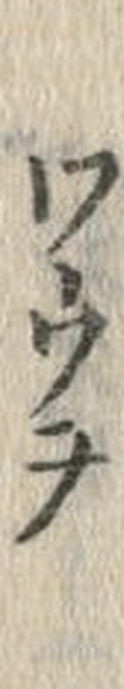ワウヲ
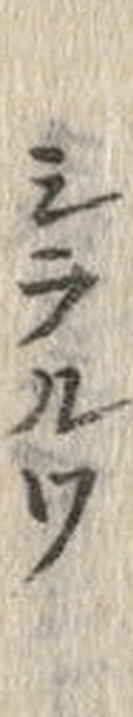シラルワ
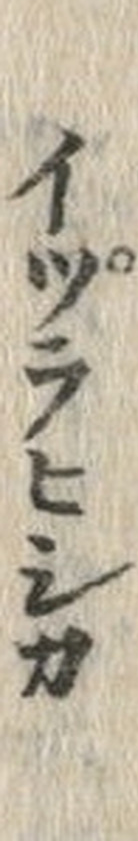イツ゚ラヒシカ

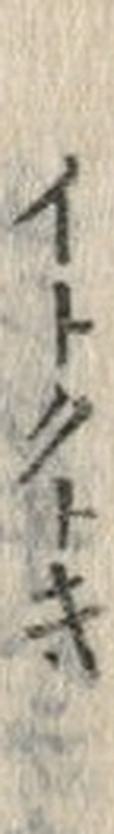イトクトキ
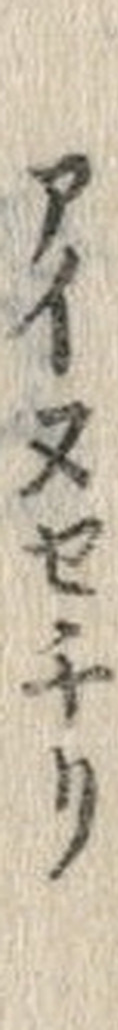アイヌセチリ
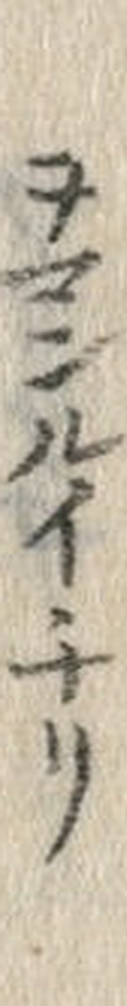ヲマンルイチリ
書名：蝦夷方言藻汐草　坤巻
